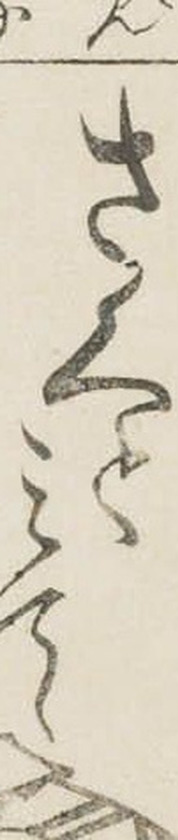さくとみて
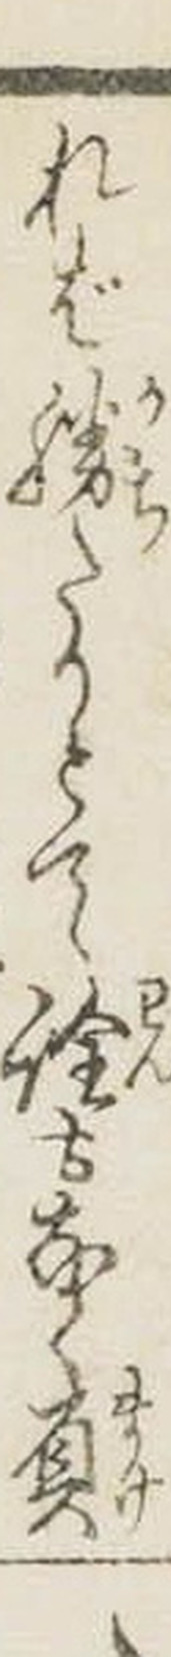れば勝たりとて倫もなく負
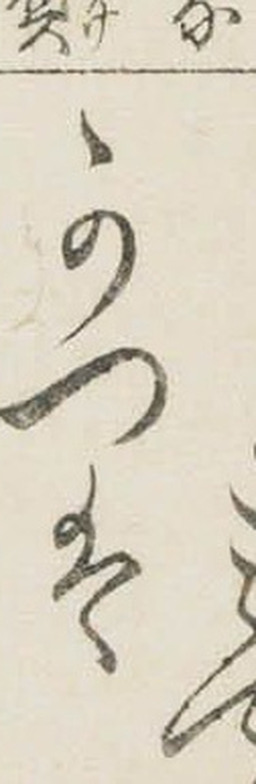かつは
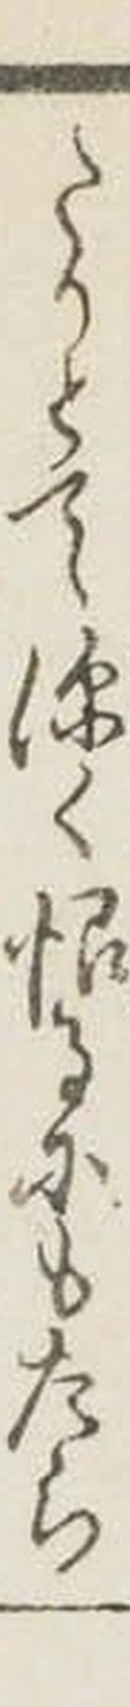たりとて深く恨るにもたら
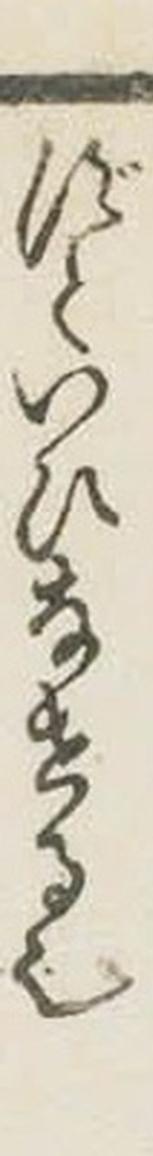ずといひなせる也
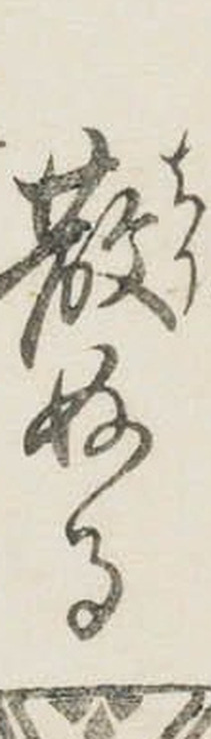散ぬる
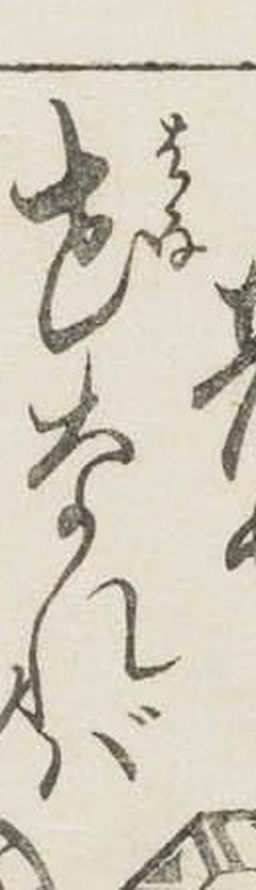花なれば
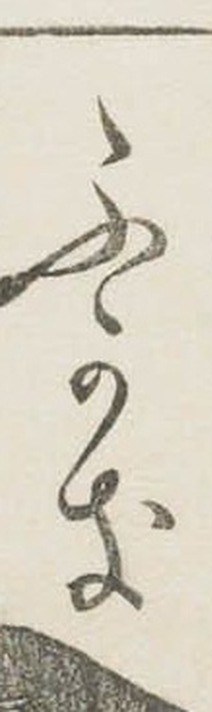ふかき
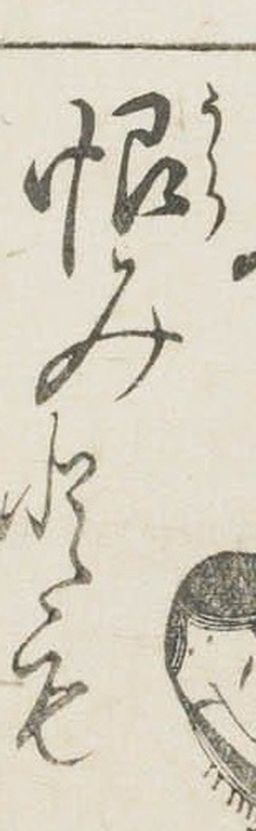恨みとも
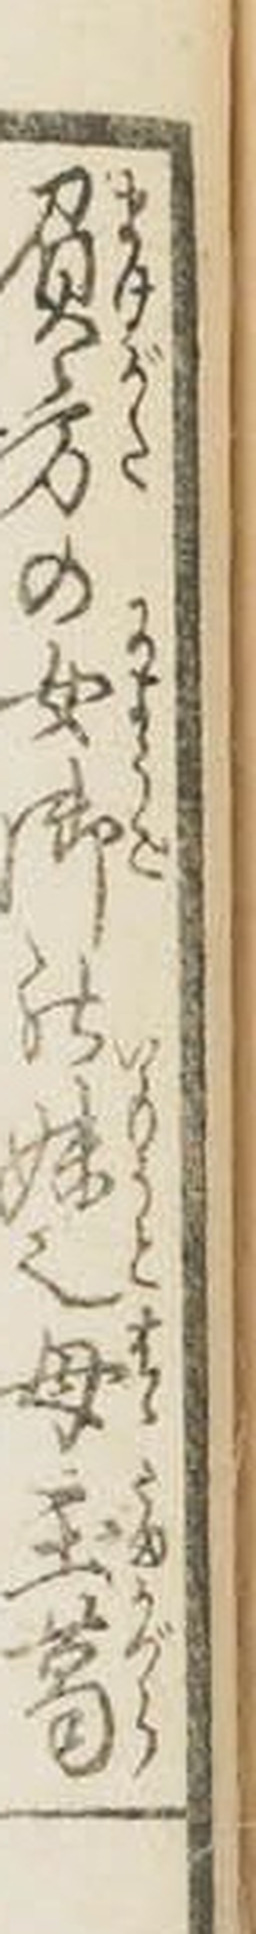負方の女御の妹也母玉葛
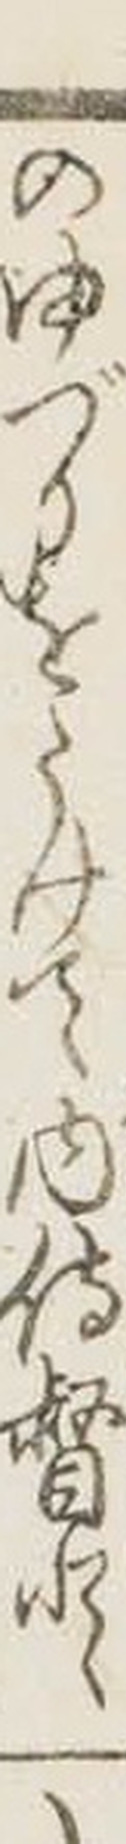のゆづりをうけて内侍督と
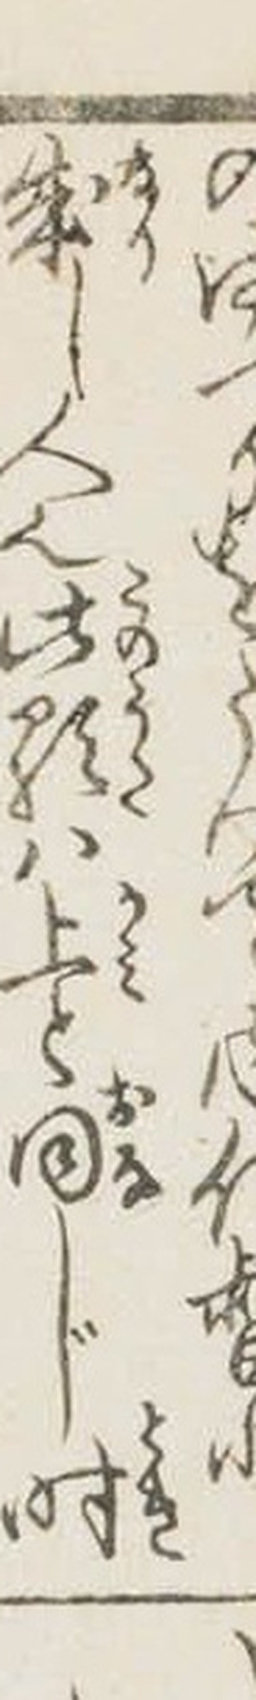成し人也此歌は上と同じ時
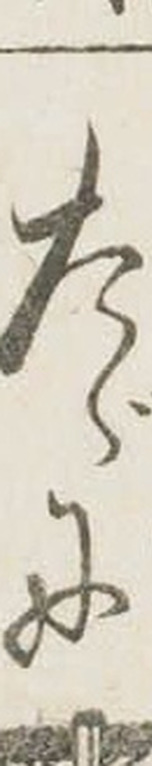たゞに
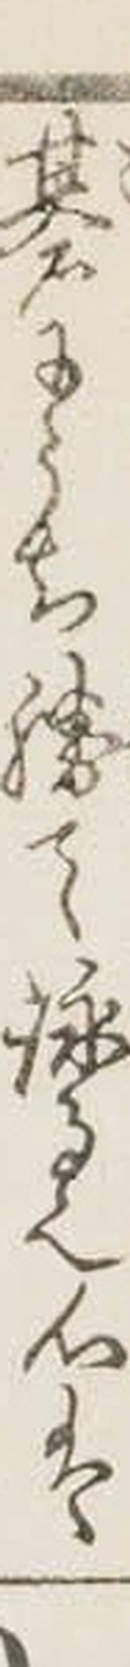碁にうち勝て詠る也心は
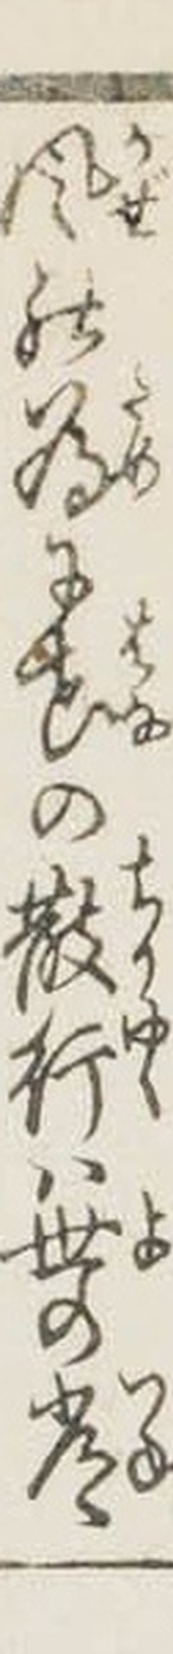風の為に花の散行は世の常
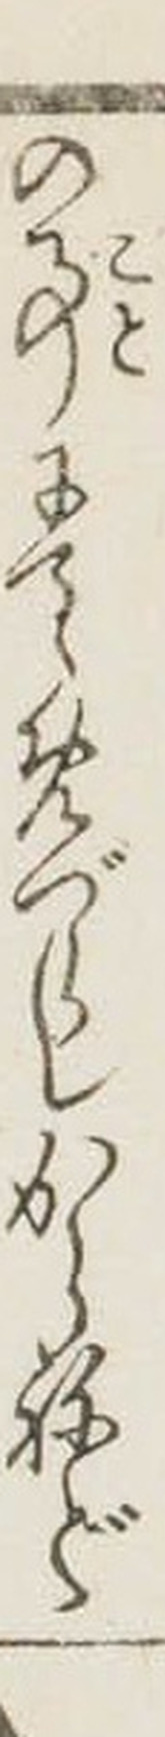の事にてめづらしからねど
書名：源氏百人一首
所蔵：東京学芸大学教育コンテンツアーカイブ
